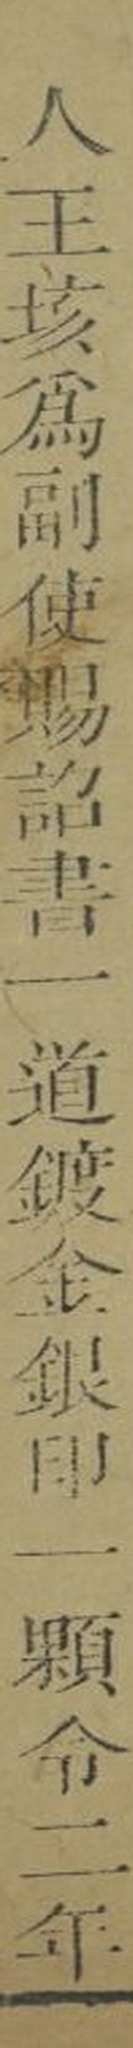人王垓為副使賜詔書一道鍍金銀印一顆令二年
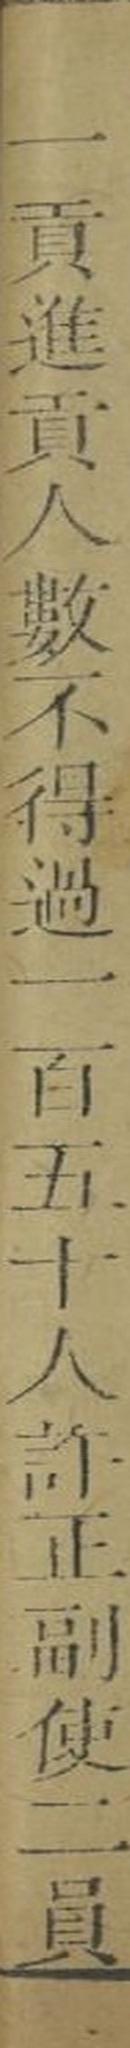一貢進貢人数不得過一百五十人許正副使二員
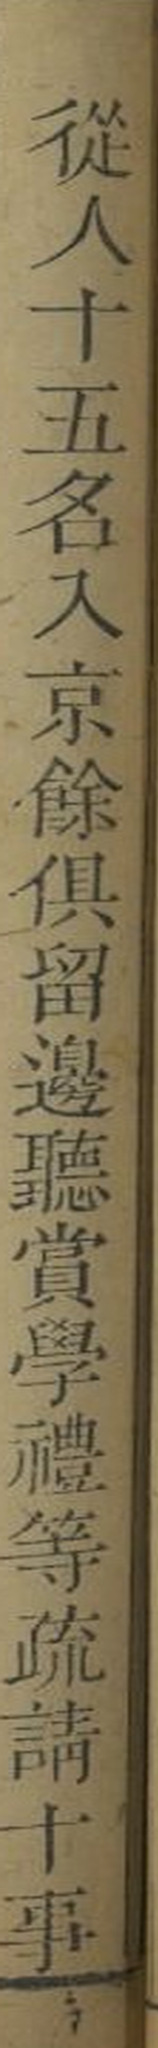従人十五名入京余俱留辺聴賞学礼等疏請十事
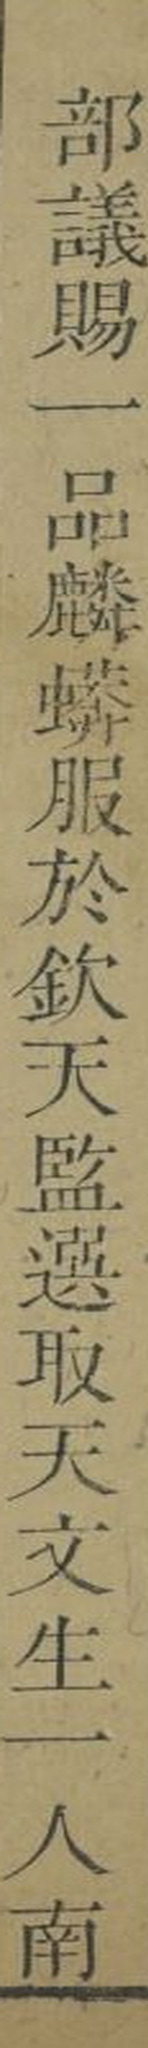部議賜一品麟蟒服於欽天監選取天文生一人南
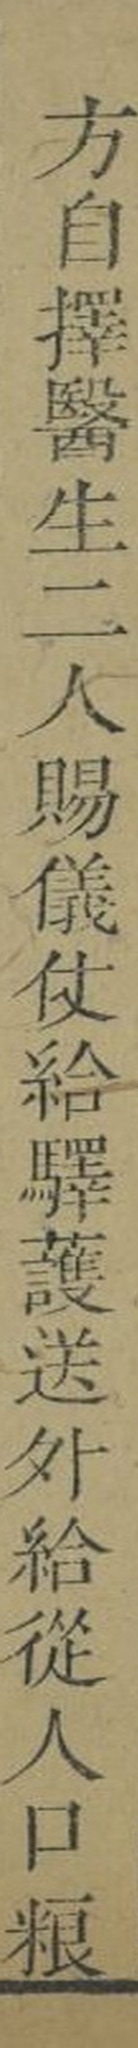方自択医生二人賜儀仗給駅護送外給従人口糧
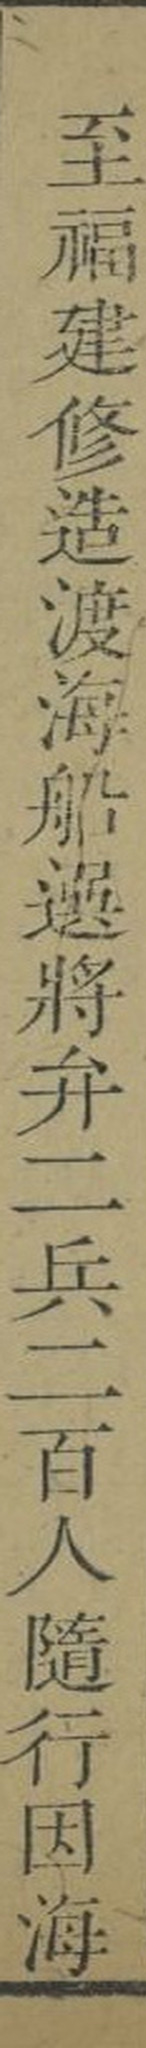至福建修造渡海船選将弁二兵二百人随行因海
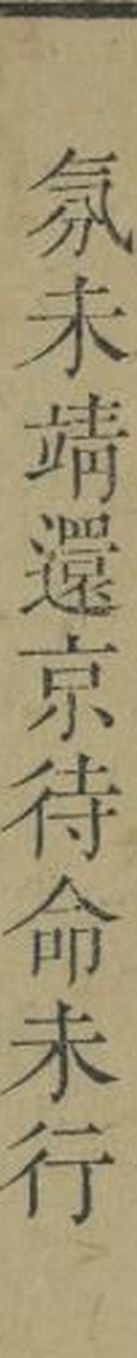氛未靖還京待命未行
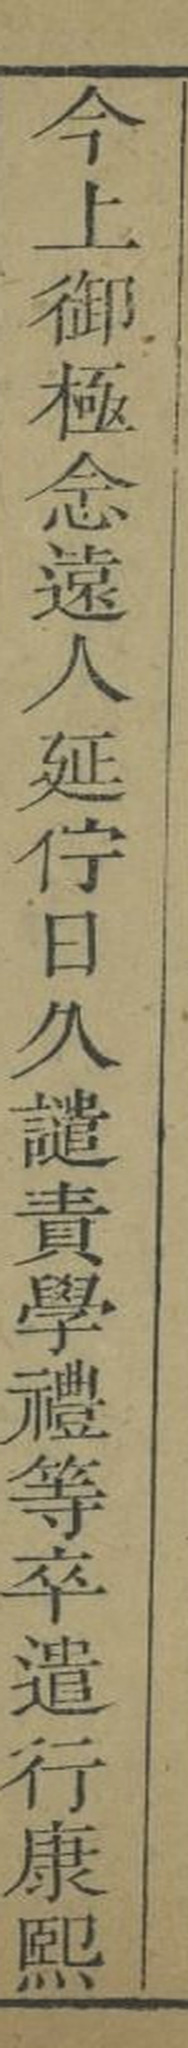今上御極念遠人延佇日久譴責学礼等卒遣行康煕
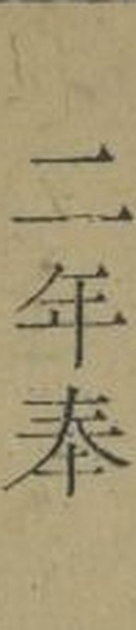二年奉
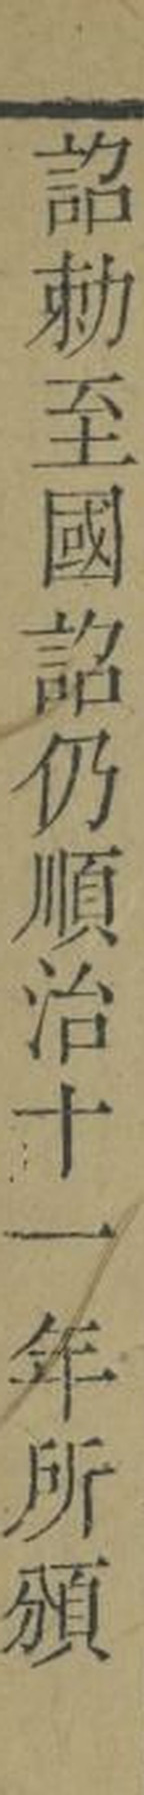詔勅至国詔仍順治十一年所頒
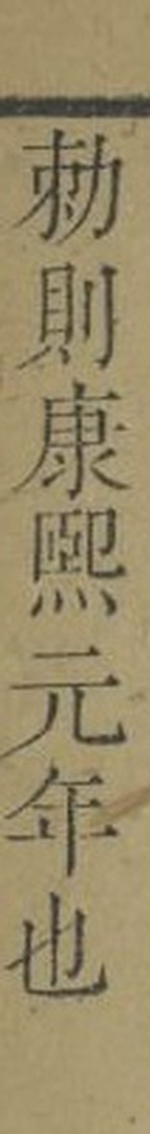勅則康煕元年也

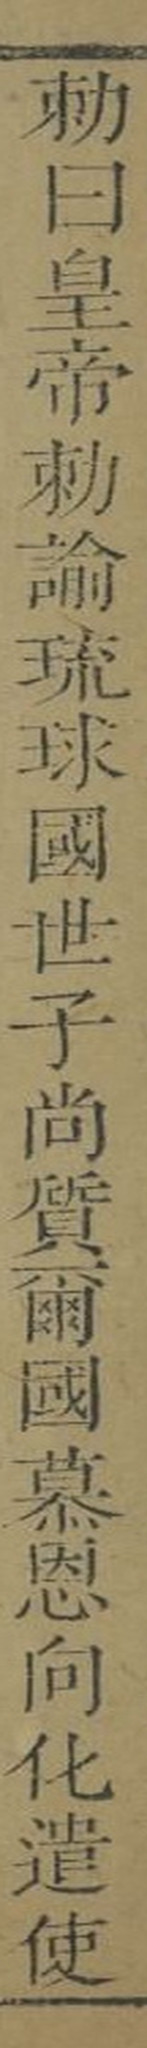勅曰皇帝勅諭琉球国世子尚質爾国慕恩向化遣使
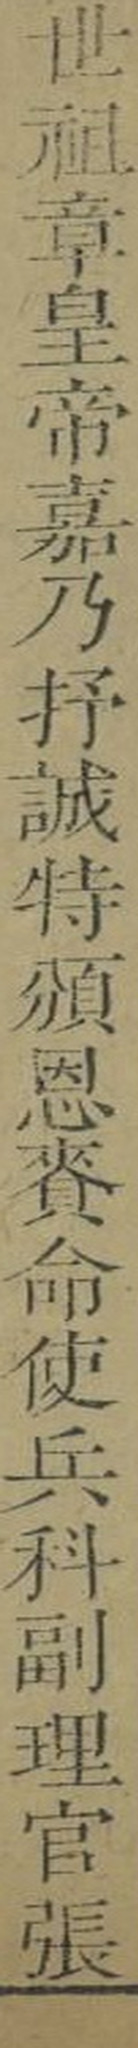世祖章皇帝嘉乃抒誠特頒恩賚命使兵科副理官張
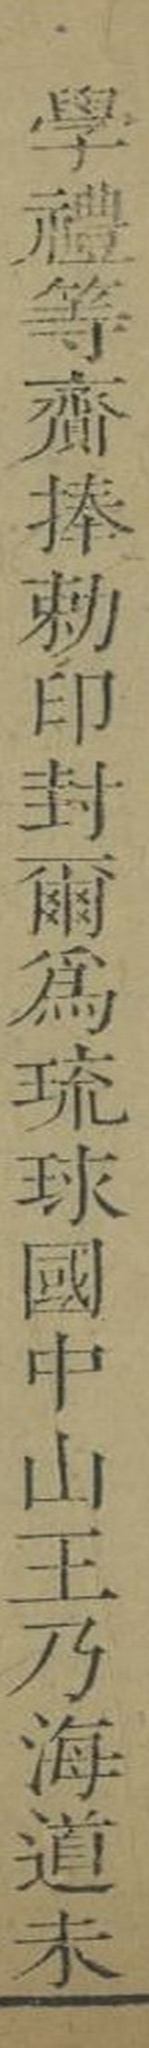学礼等齎捧勅印封爾為琉球国中山王乃海道未
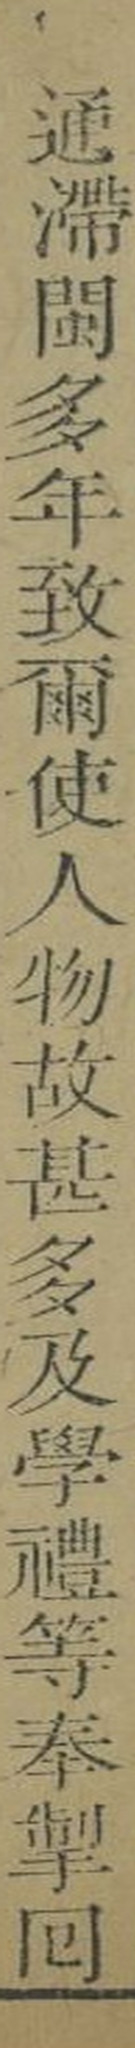通滞閩多年致爾使人物故甚多及学礼等奉掣回
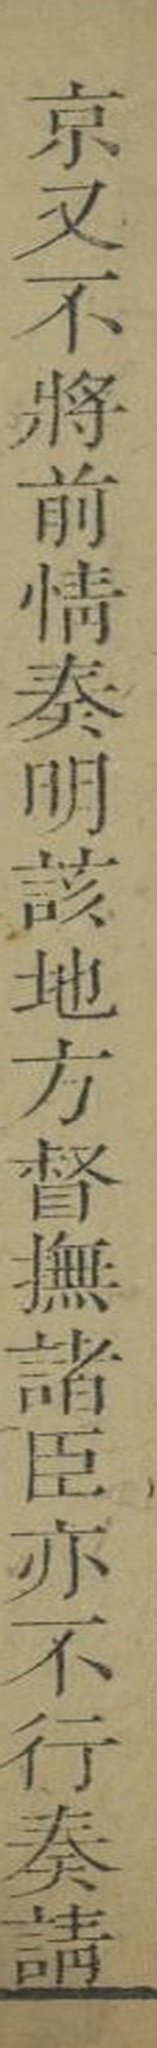京又不将前情奏明該地方督撫諸臣亦不行奏請
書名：中山伝信録 巻四
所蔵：University of the Ryukyus Library
